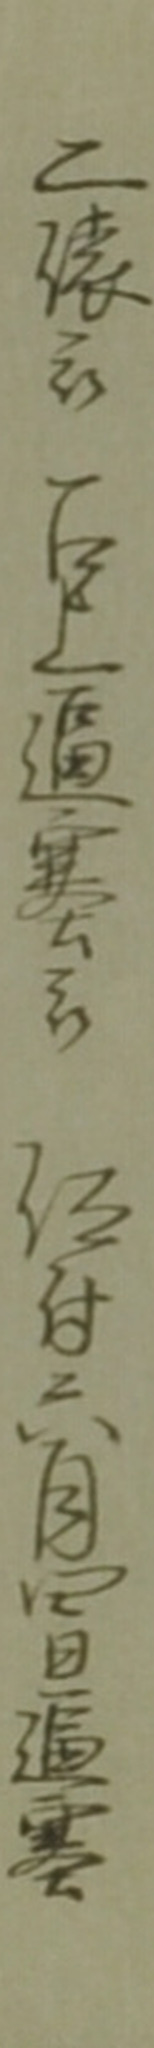二俵被召上逼塞被仰付六月四日逼塞

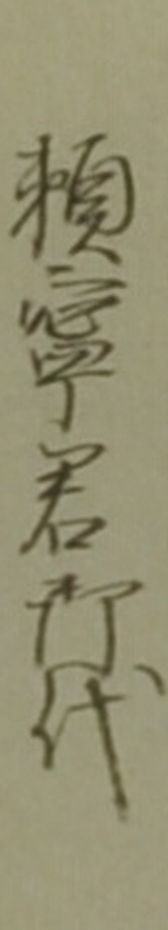頼寧君御代
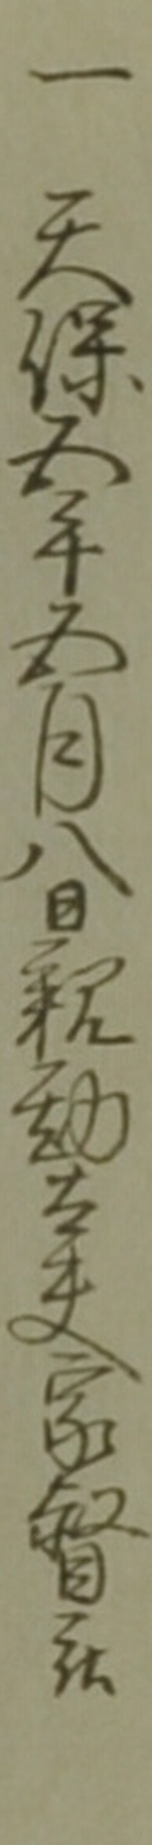一天保五午五月八日親勘太夫家督被

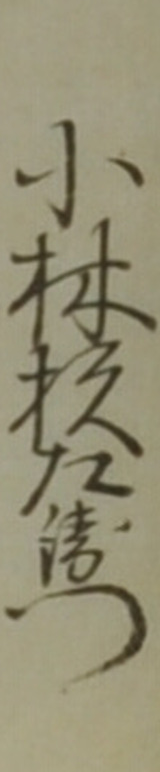小林杉左衛門
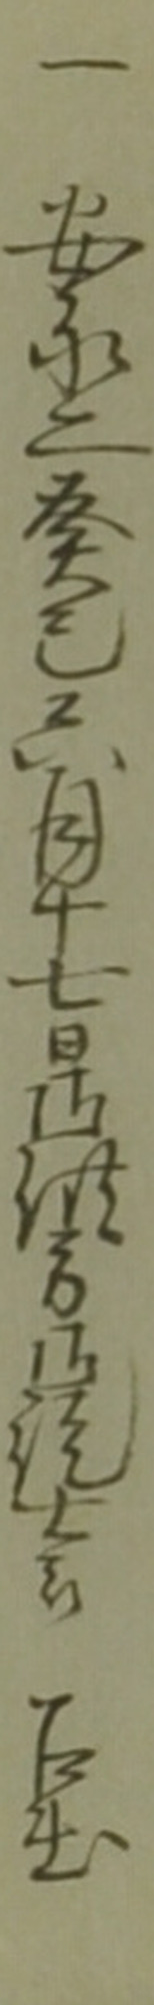一安永二癸巳六月十七日御供方御徒士被召出
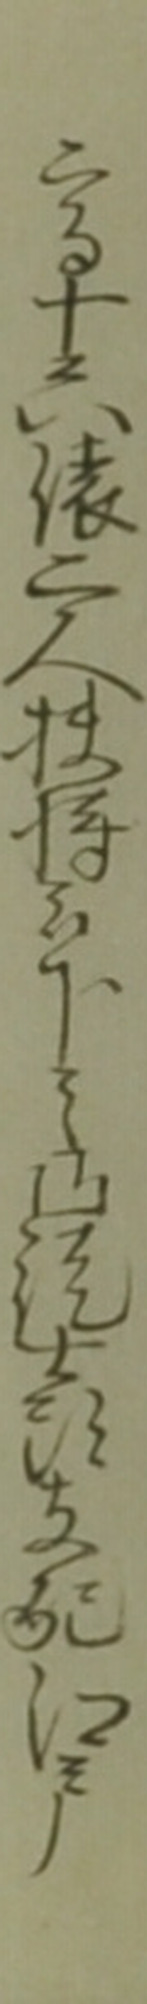高十六俵二人扶持被成下御徒士頭支配江戸

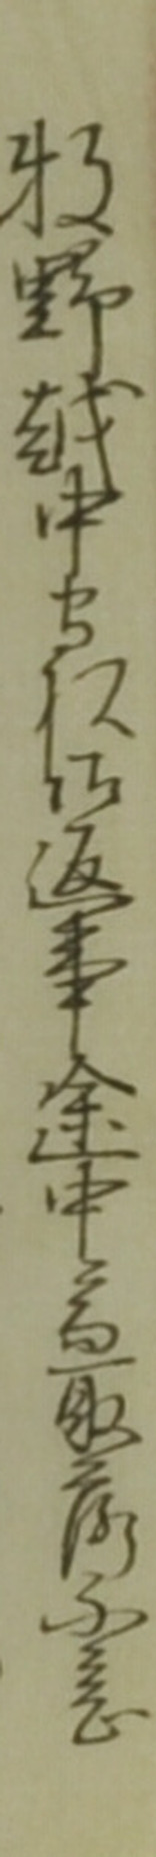牧野越中髪守様御返事途中ニ而取落不念
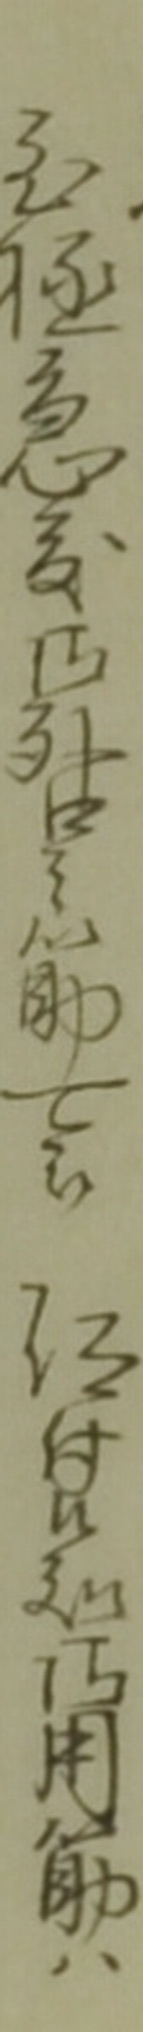至極急度御咎之筋可被仰付候処御用筋ハ
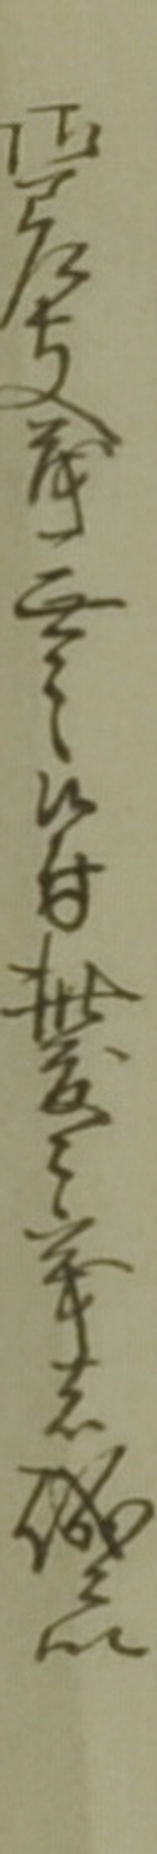御差支茂無之候付此度之義者誠ニ以
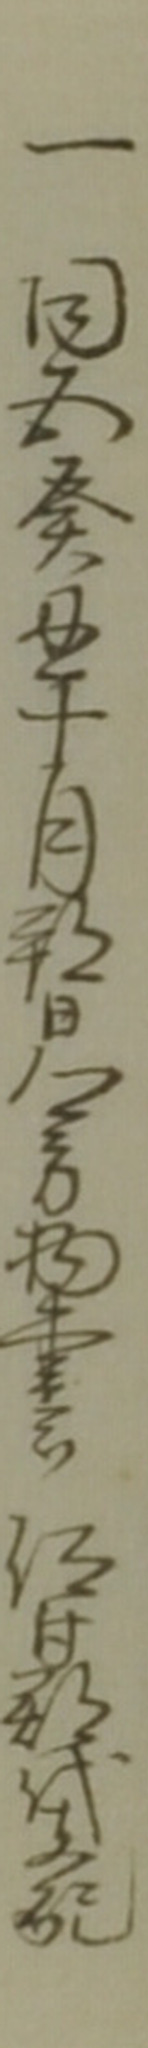一同五癸丑十月朔日郷方物書被仰付郡代支配
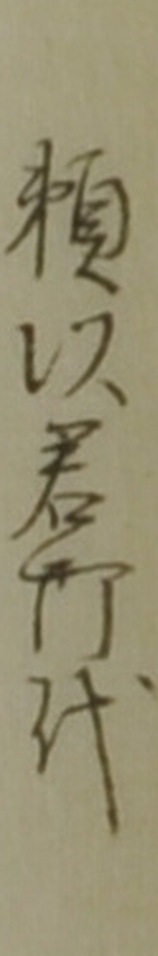頼以君御代
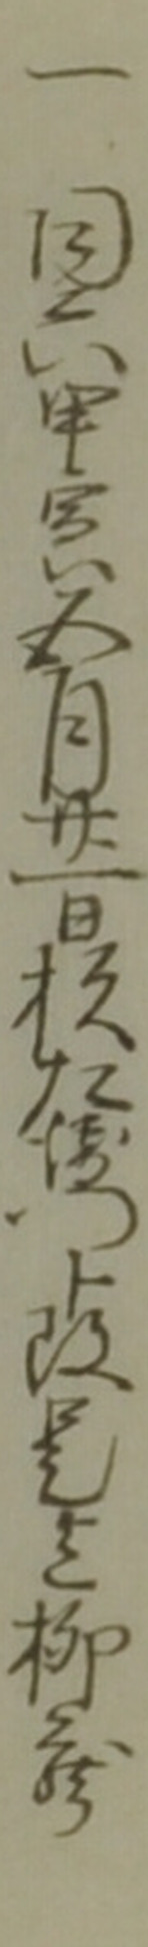一同六甲寅五月廿一日杉左衛門ト改是迄柳蔵
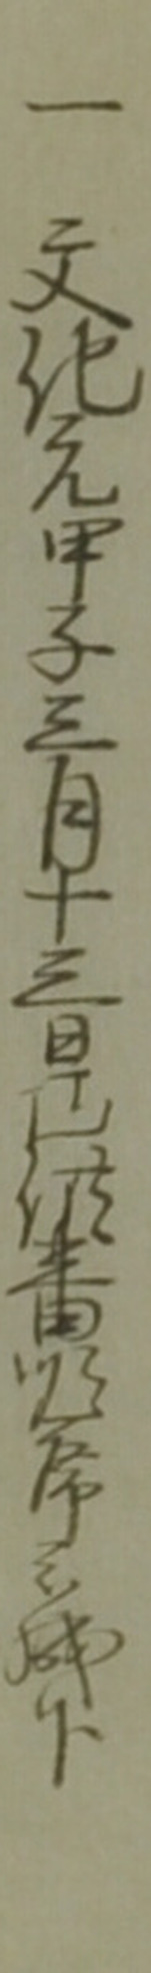一文化元甲子三月十三日御供番順席被成下
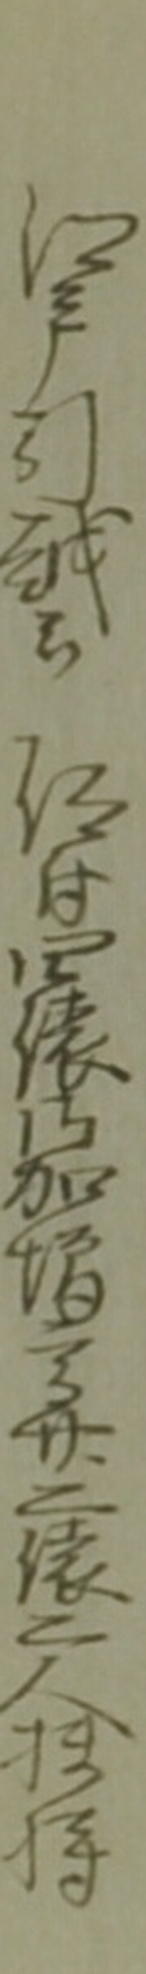江戸引越被仰付四俵御加増高廿二俵二人扶持
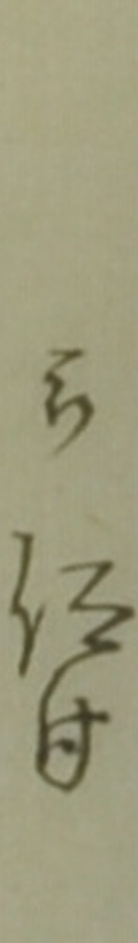被仰付
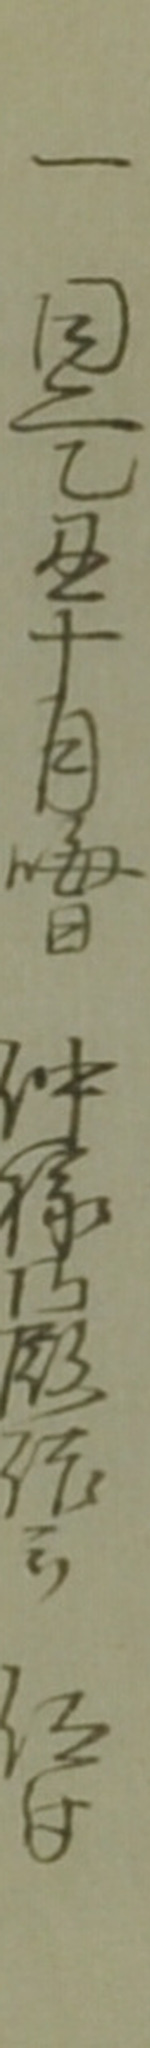一同二乙丑十月晦日仲様御殿詰被仰付
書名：無足諸士勤仕録（七）
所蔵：伊那市立高遠町図書館・合同会社AMANE
